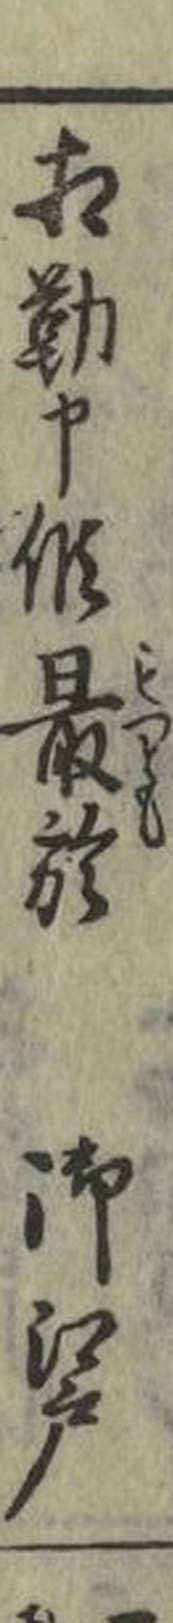相勤申但最於御江戸
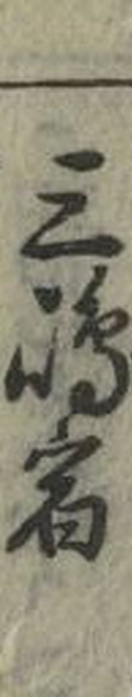三嶋宿
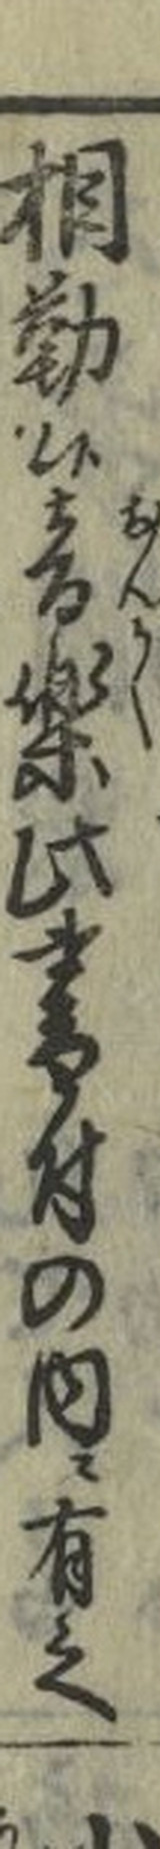相勤候音楽の書付の内有之
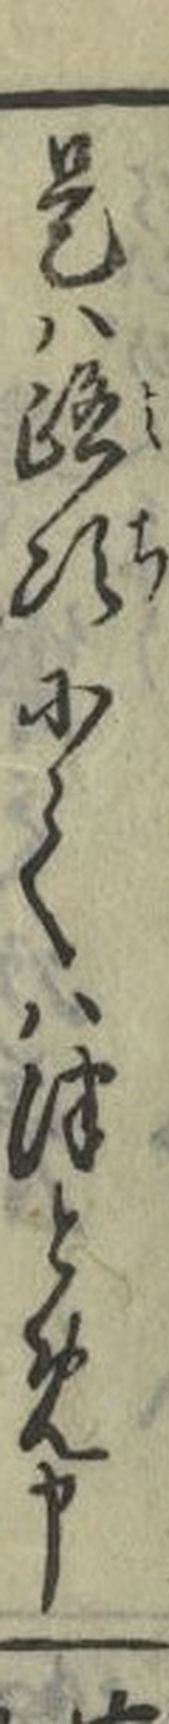是は路次にてはつとめ申
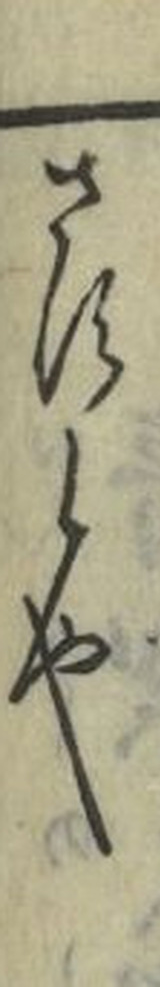さすとや
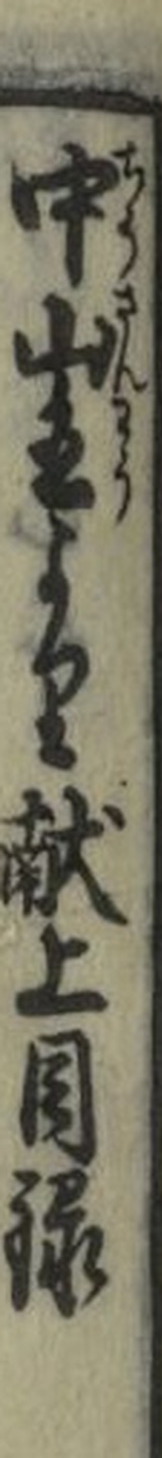中山王より献上目録
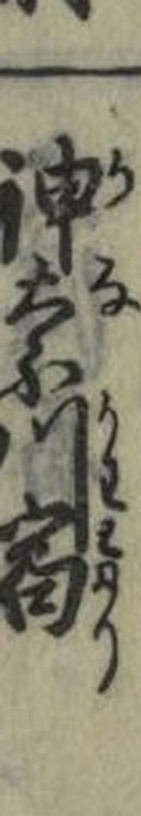神奈川宿
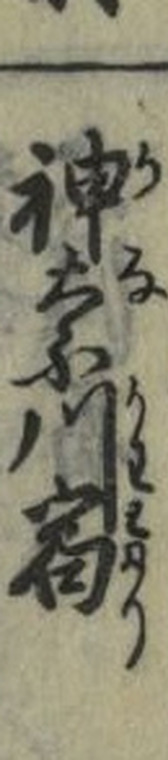神奈川宿
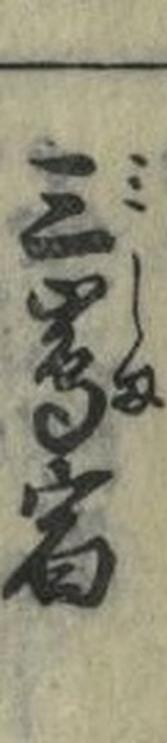三嶋宿
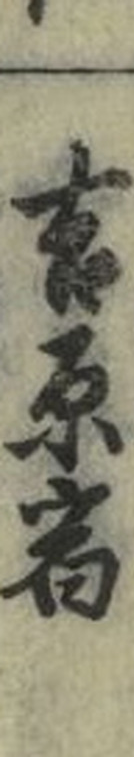吉原宿
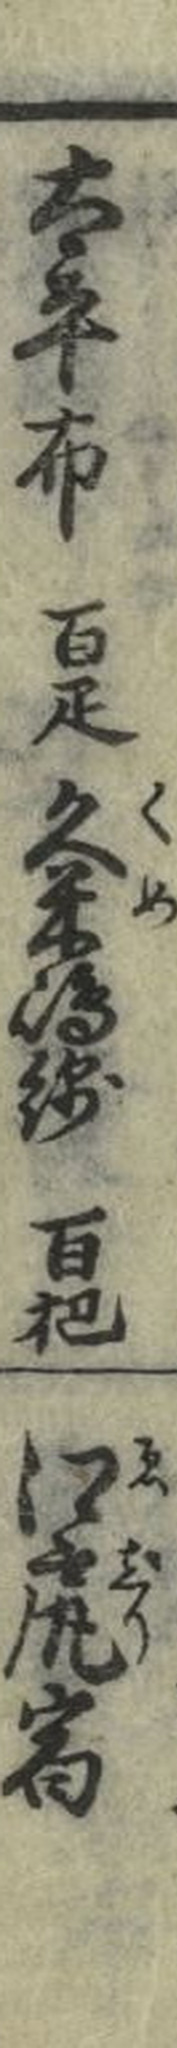太平布百疋久米嶋綿百把
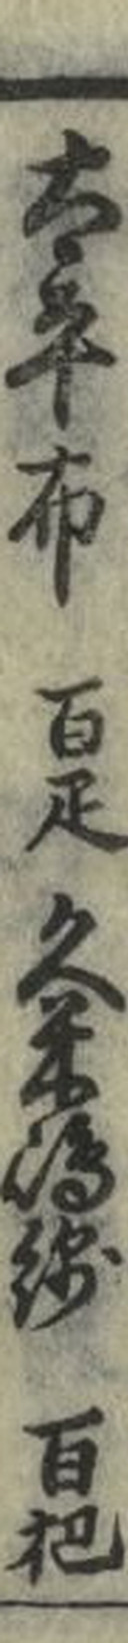太平布百疋久米嶋綿百把
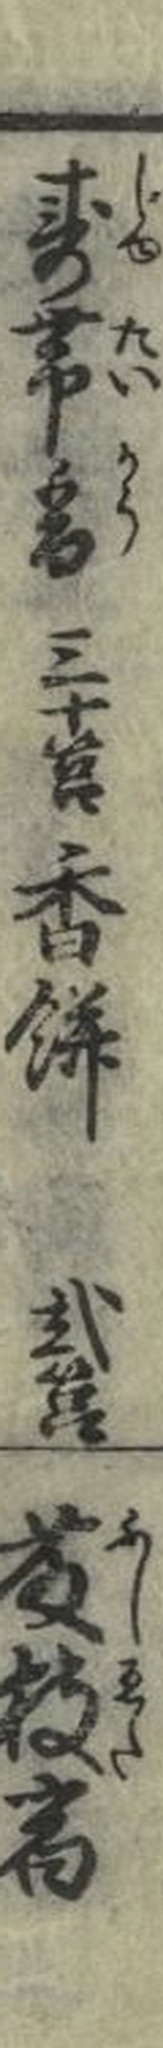寿帯香三十袋香餅弐箱

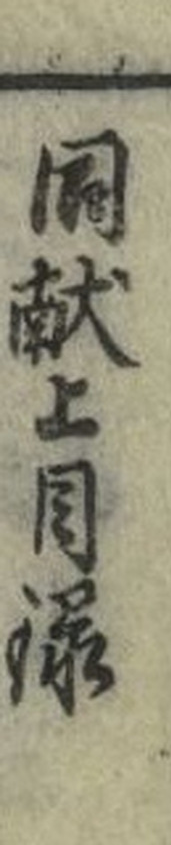同献上目録
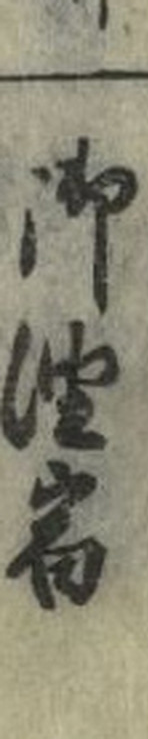御油宿
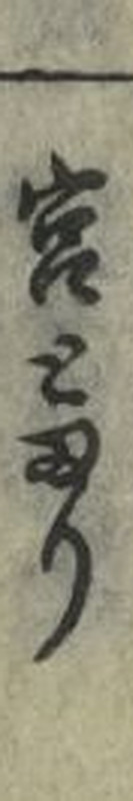宮とまり
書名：琉球人大行列記
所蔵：University of the Ryukyus Library
